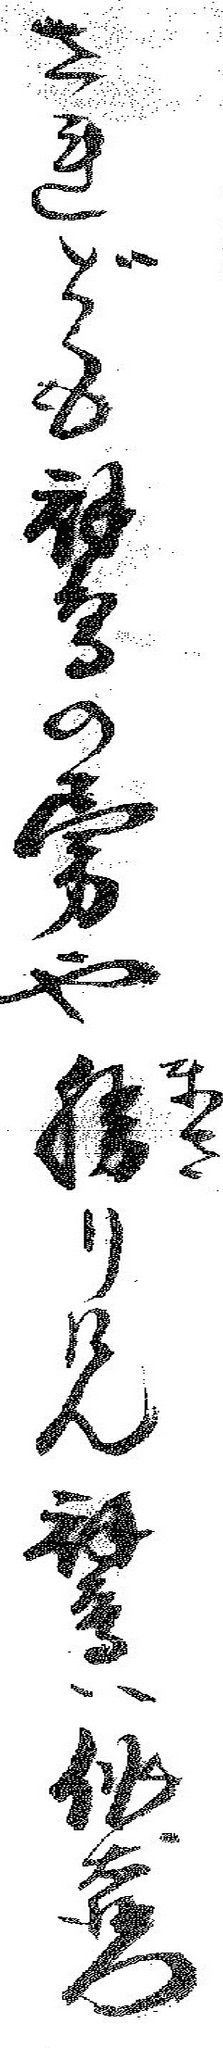されども鷹の勇や勝りけん鷹は作右衛門
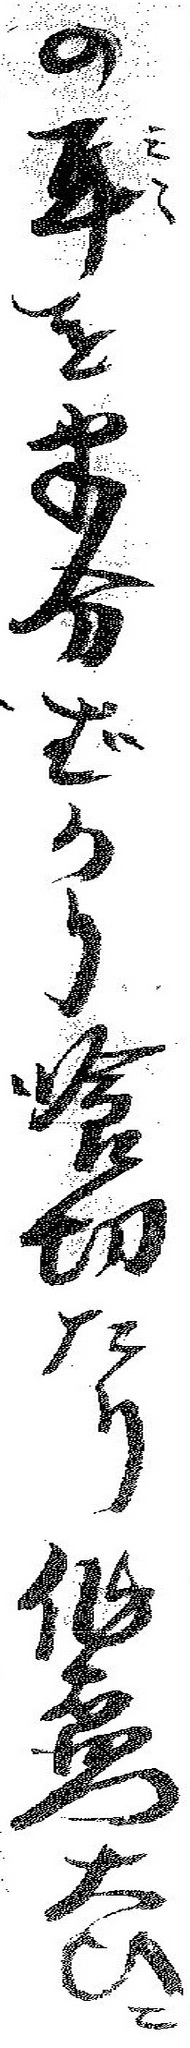の耳を半分ばかり喰切たり作右衛門大ひに
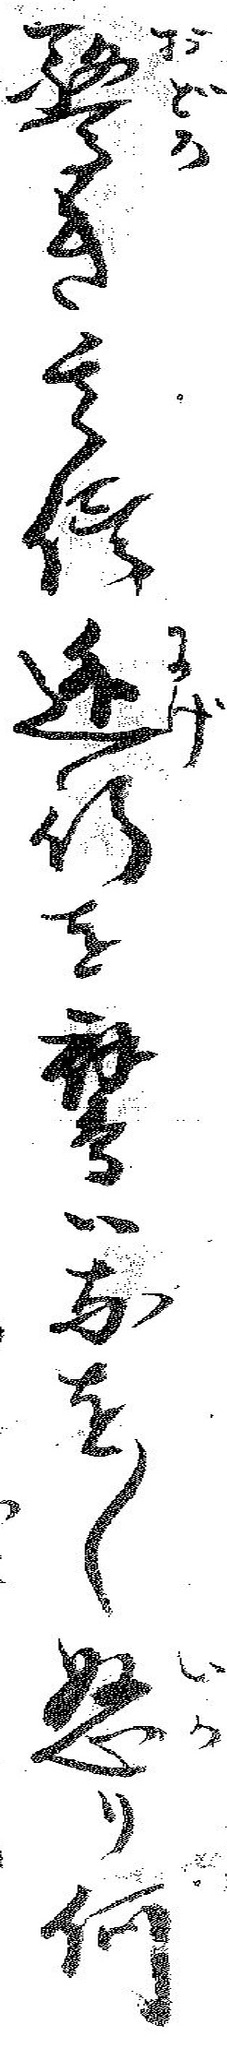驚き其侭逃行を鷹はなを〳〵怒り何
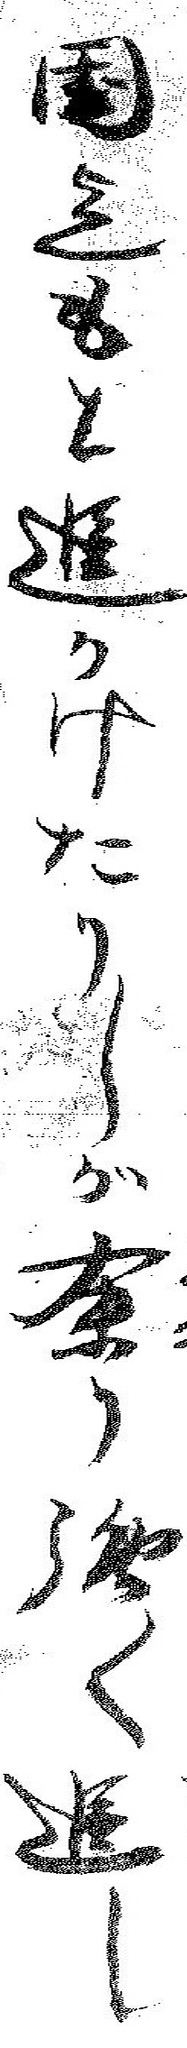国迄もと追かけたりしが余り強く追し
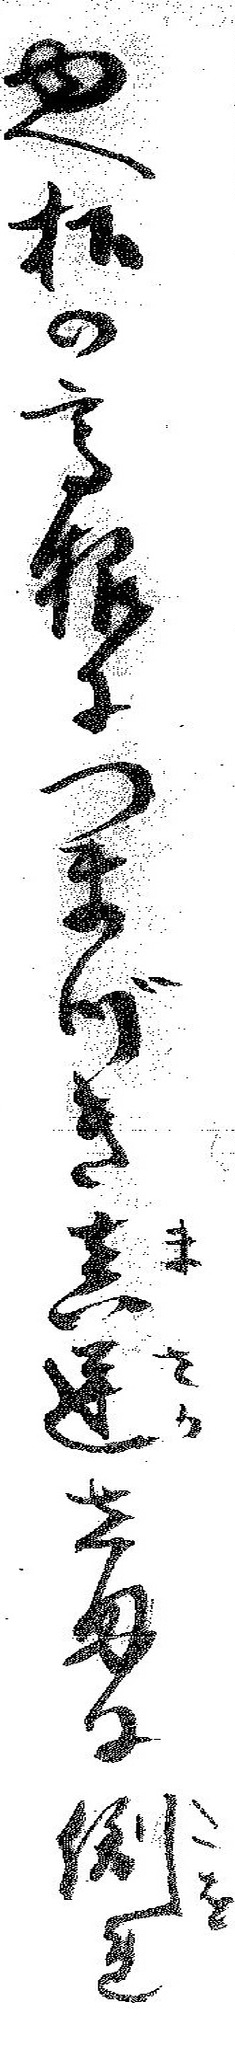ゆへ松の高根につまづき真逆さまに倒れ
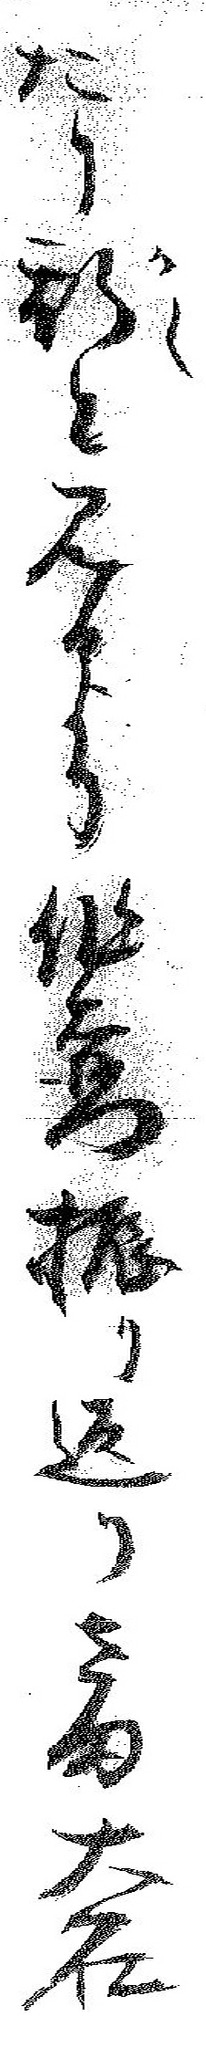たり斯と見るより作右衛門振り返りさま大石
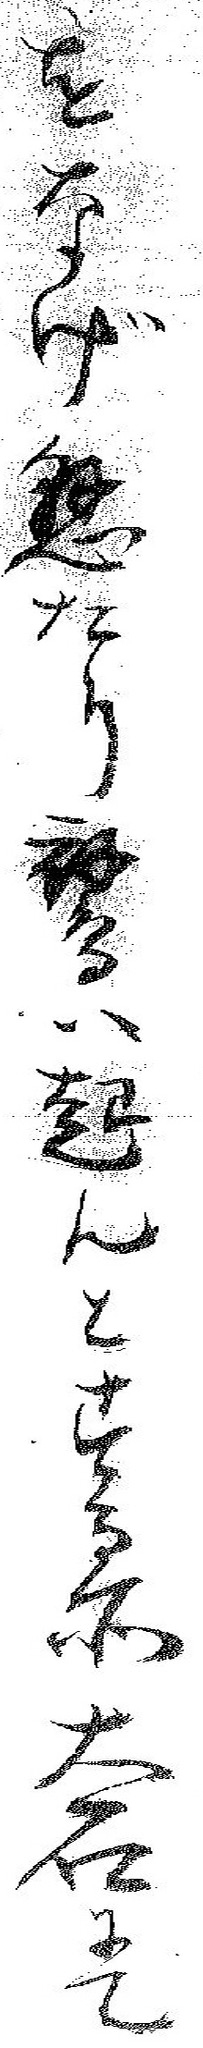をなげ懸たり鷹は起んとする所大石にて
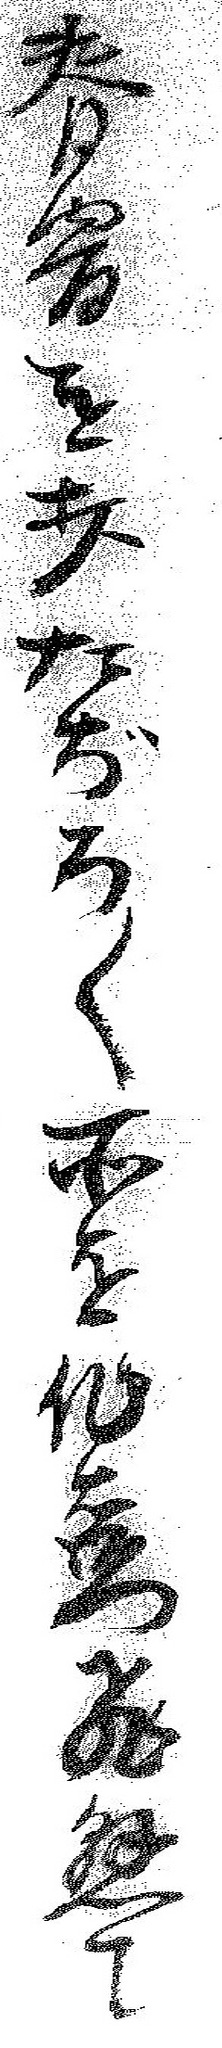背骨を折たぢろく所を作右衛門飛懸て
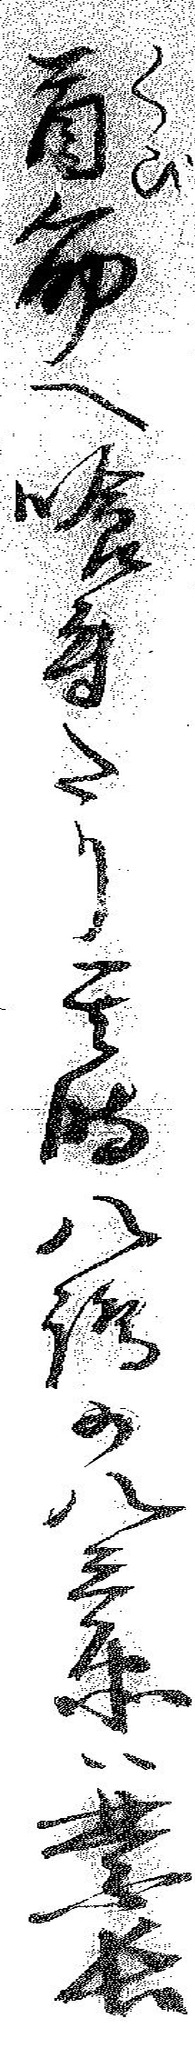首筋へ喰付たり其時八嶋の八兵衛は禁長
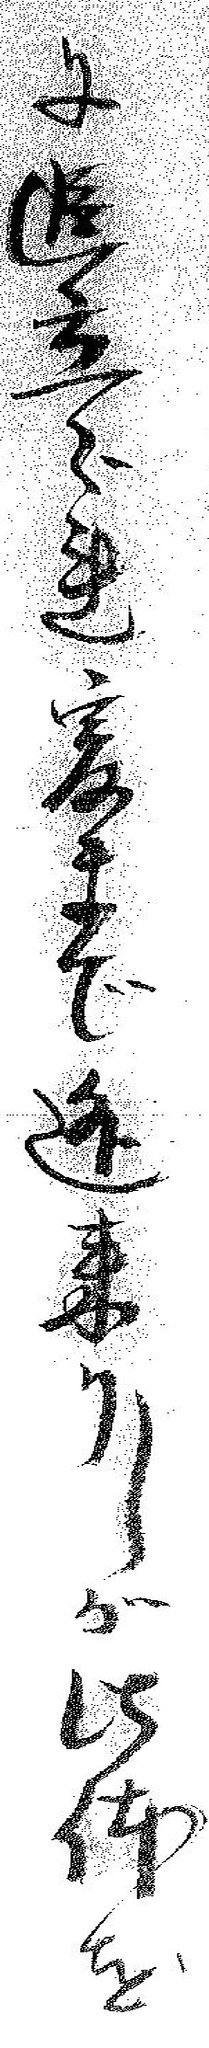に追立られ爰まで逃来りしが此体を
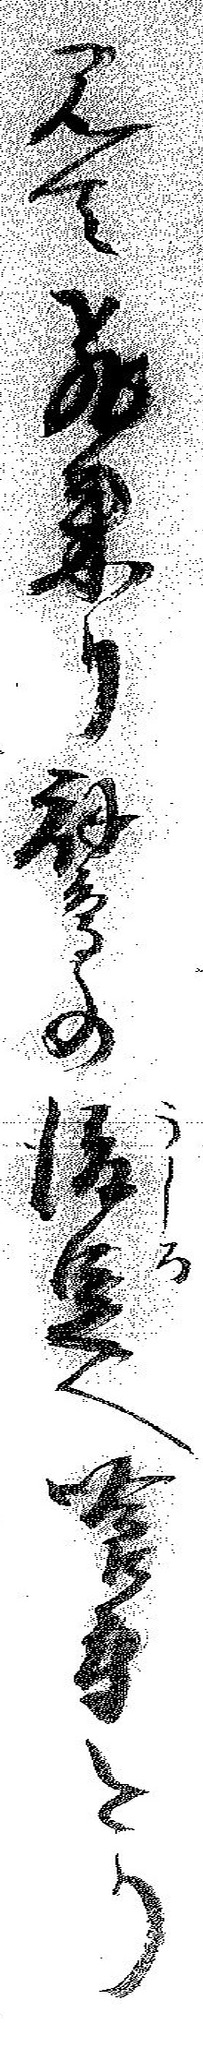見て飛来り鷹の後足へ喰付たり
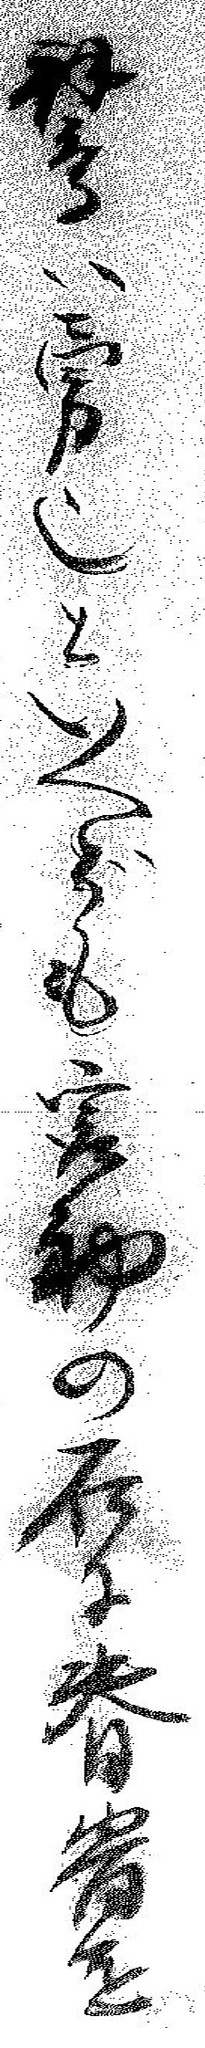鷹は勇也といへども最初の石に背骨を
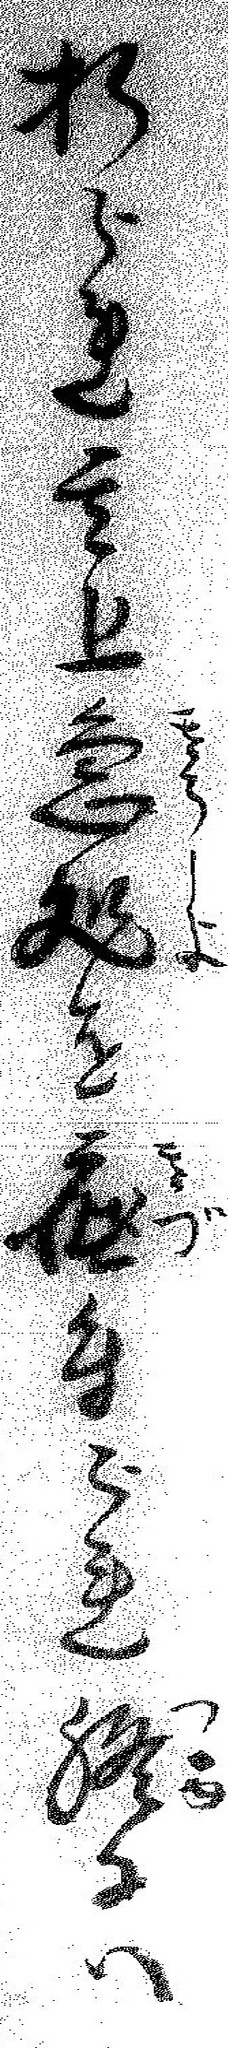折られ其上急処を疵付られ終には

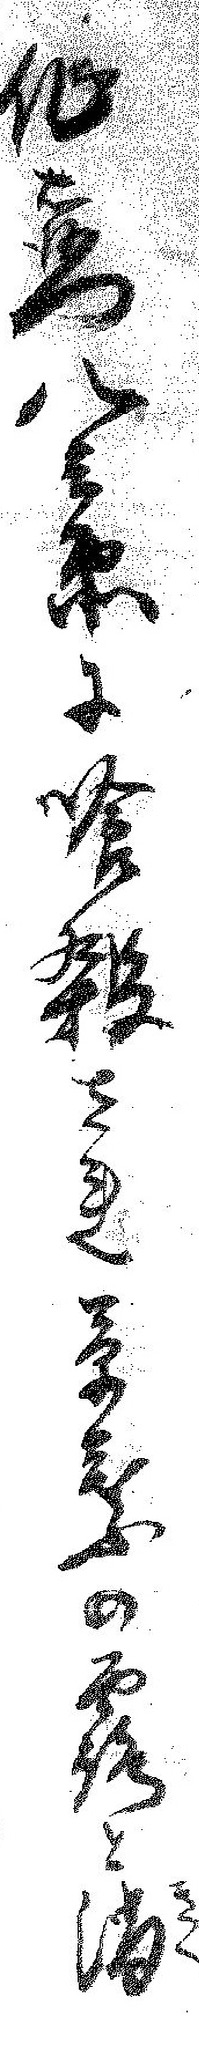作右衛門八兵衛に喰殺され草葉の露と消
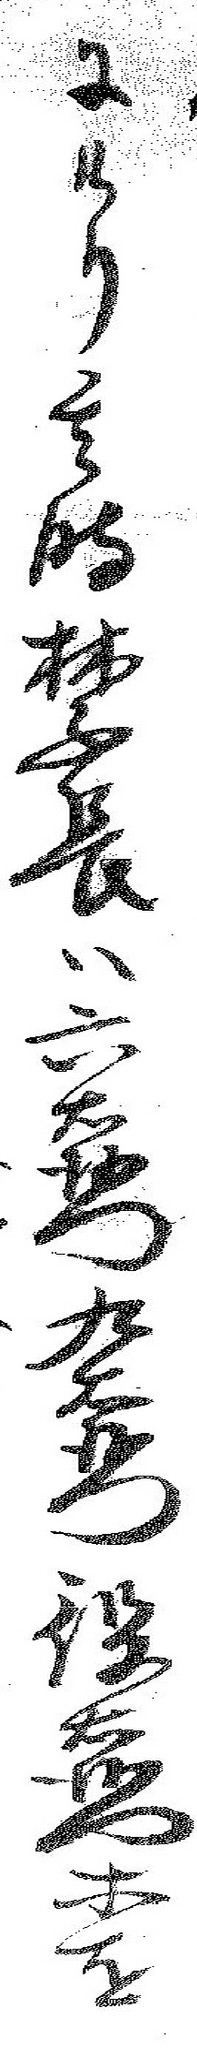にけり其時禁長は六右衛門久左衛門役右衛門等を
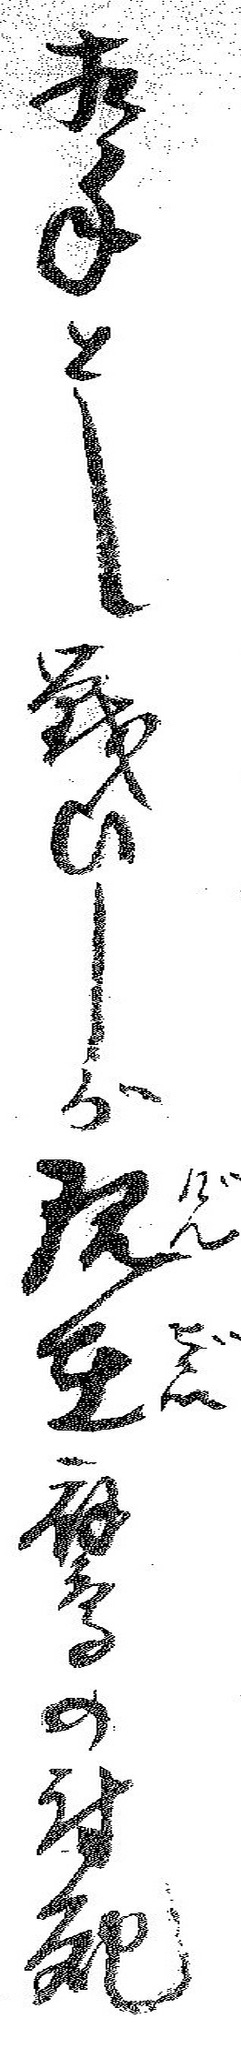相手とし戦ひしが現在鷹の討死
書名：近頃古狸珍説　礼義智信
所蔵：徳島県立図書館
